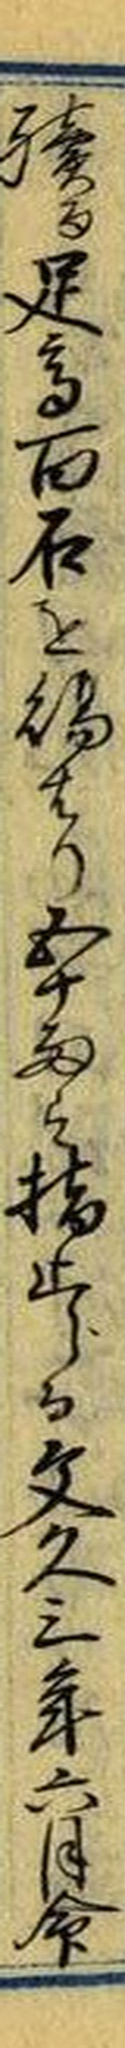続而足高百石を賜はり五十両は指止らる文久三年六月命
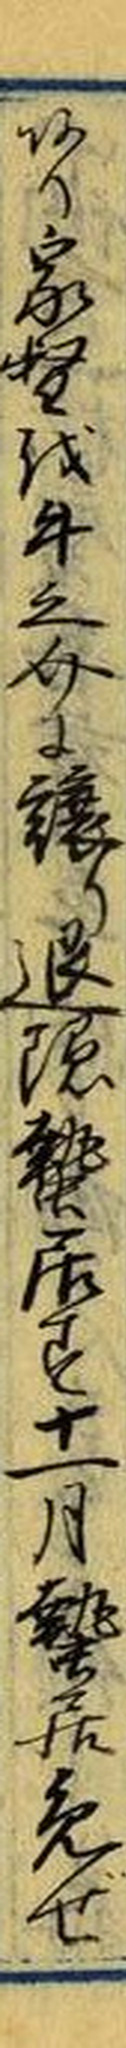あり家督を牛之介に譲り退隠蟄居す十一月蟄居免ぜ
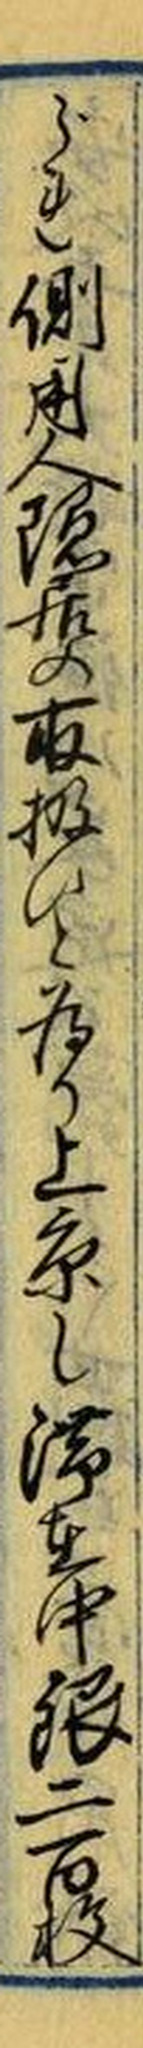られ側用人隠居の取扱いとなり上京し滞在中銀二百枚
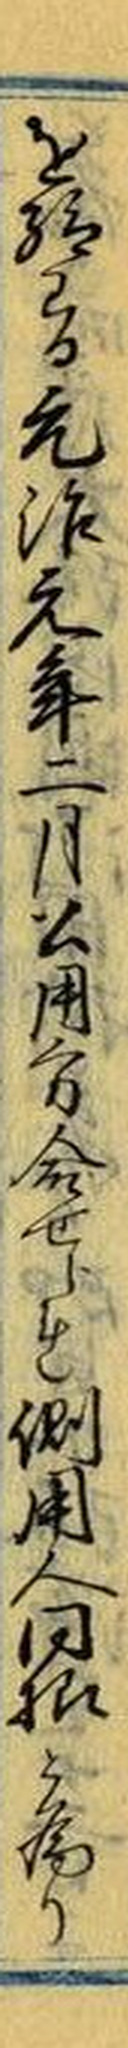を給わる元治元年二月公用方命せられ側用人同様と為り
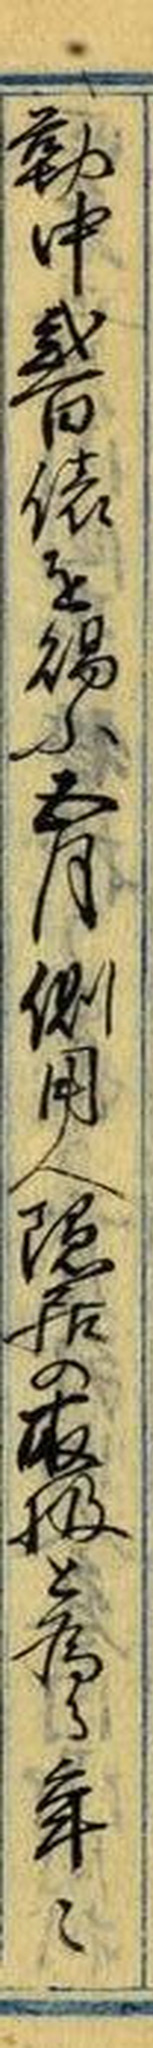勤中弐百俵賜ふ五月側用人隠居の取扱と為る年々
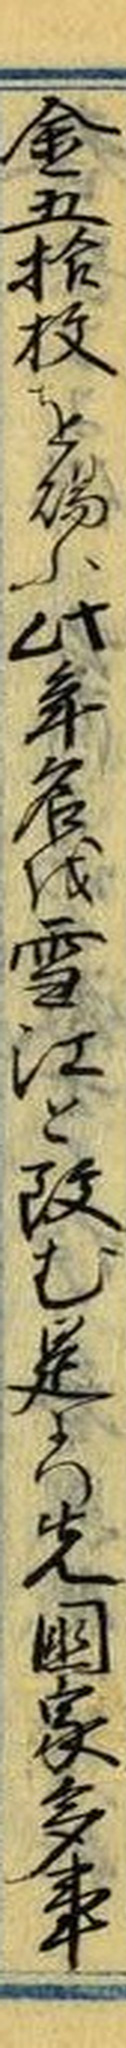金五拾枚を賜ふ此年名を雪江と改む是より先国家多事
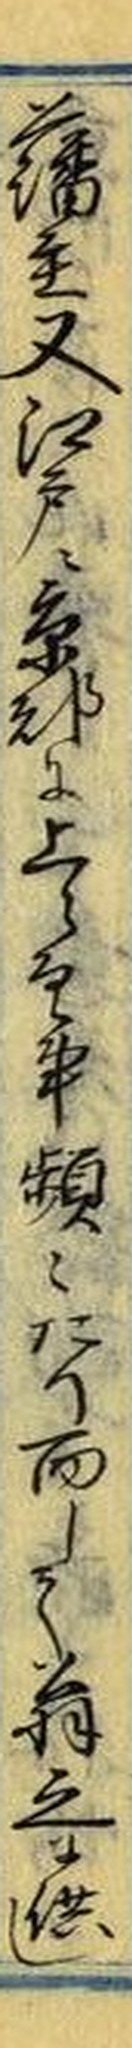藩主又江戸ニ京都に上らるゝこと̪頻々なり而して翁之に供し
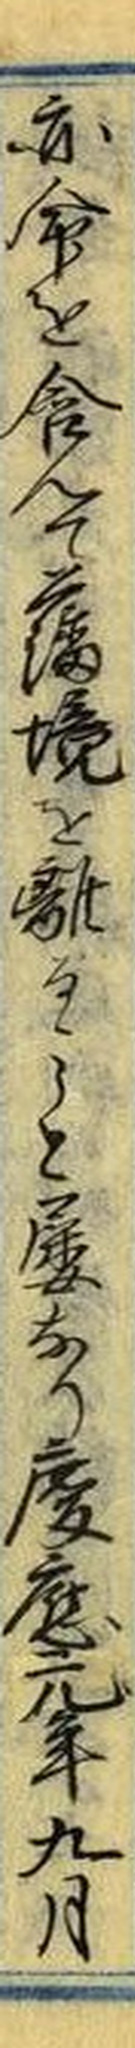亦命を含んて藩境を離るゝこと屡なり慶応元年九月
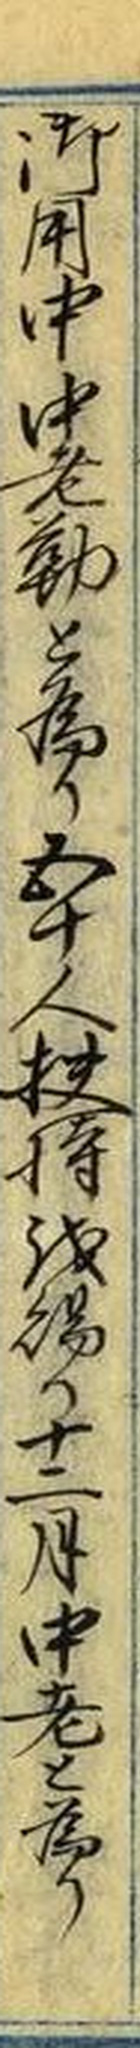御用中中老勤と為り五十人扶持を賜り十二月中老と為り
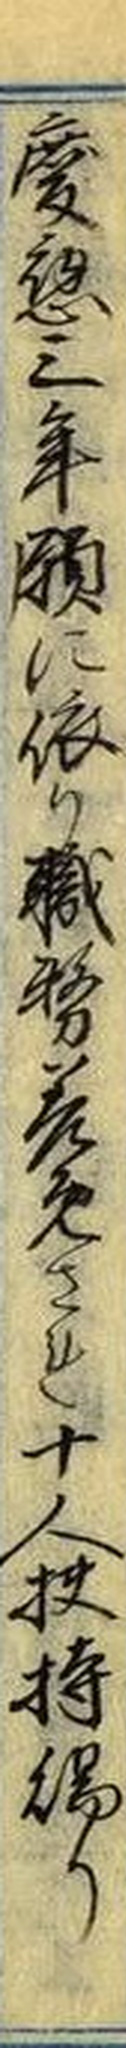慶応三年願に依り職務差免され十人扶持賜り
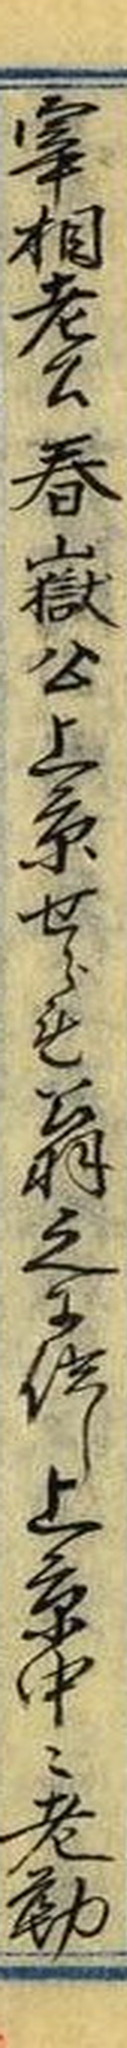宰相老公春嶽公上京せられ翁之に供し上京中二老勤
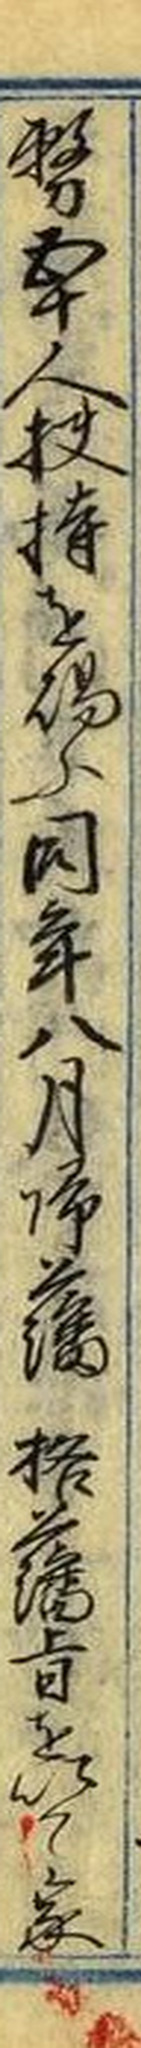務五十人扶持を賜ふ同年八月帰藩格藩旨を以て家
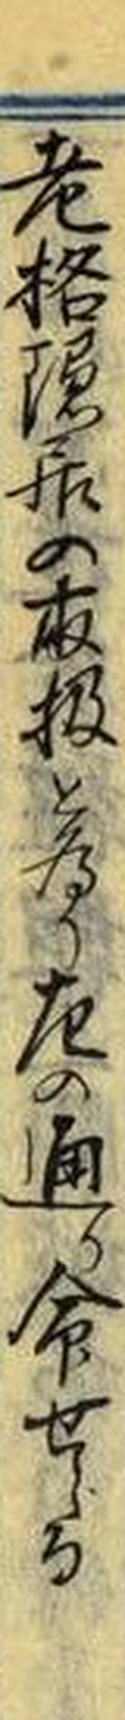老格隠居の取扱と為り左の通り命せらる

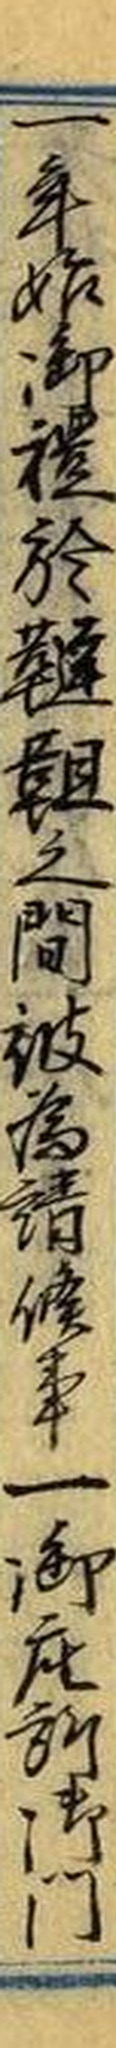一年始御礼於韃靼之間被為請候事一御座所御門
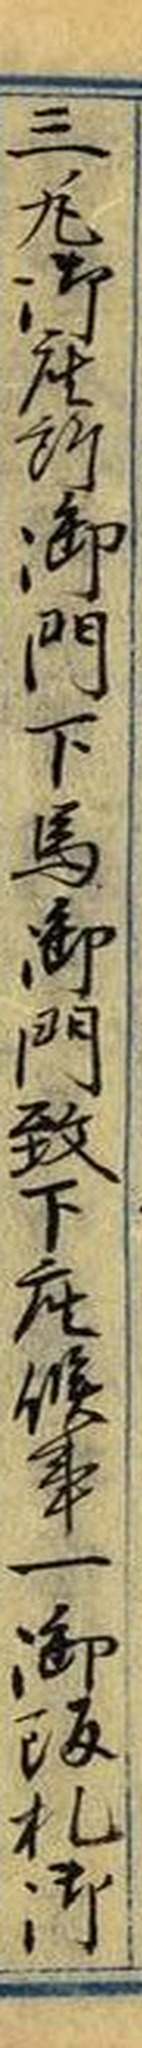三ノ丸御座所御門下馬御門致下座候事一御改札御
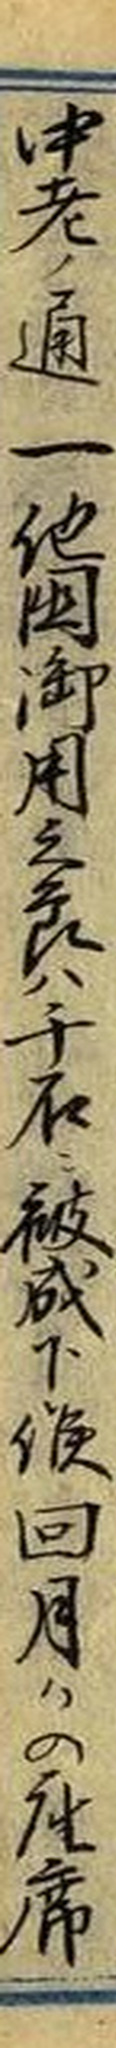中老ノ通一他国御用之節ハ千石ニ被成下候回月々の座席
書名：温古集 三巻
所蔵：福井県文書館 Fukui Prefectural Archives
